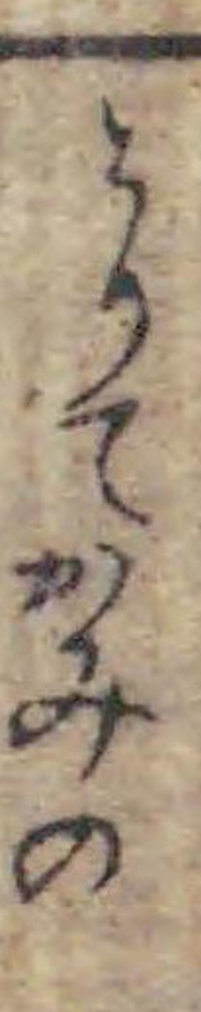とりてかみの
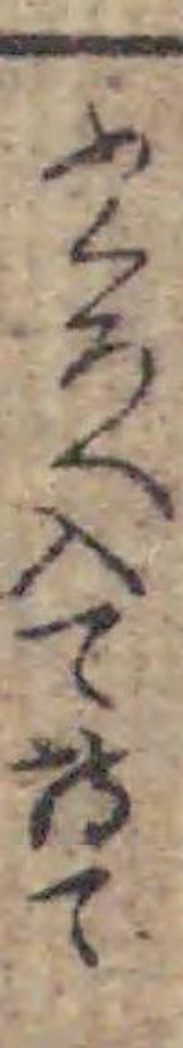ふくろへ入て持て
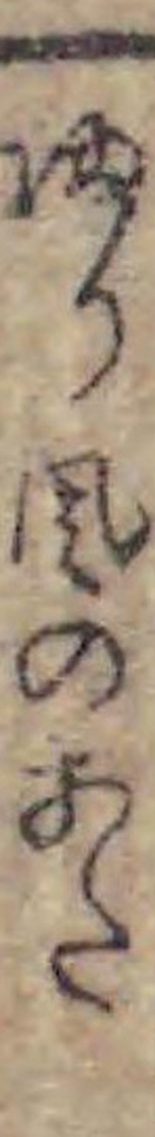ふり風のあた
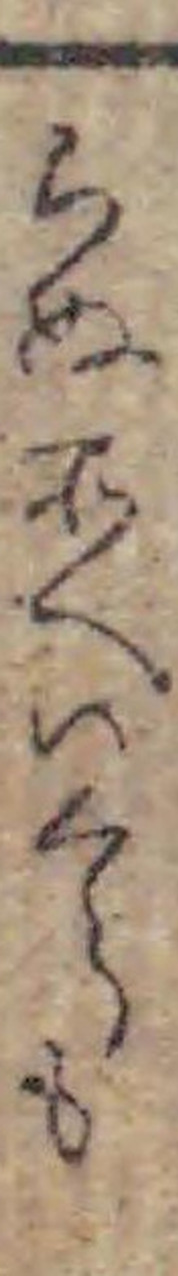らぬ所へいくらも
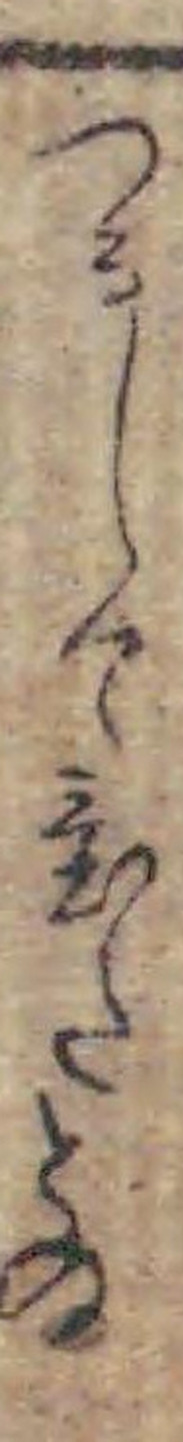つるして置たとの
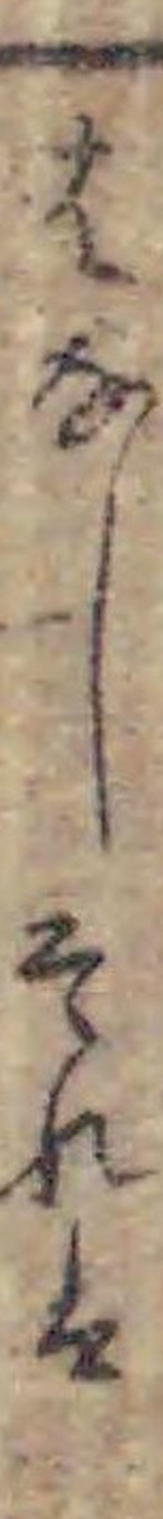はなしそれは
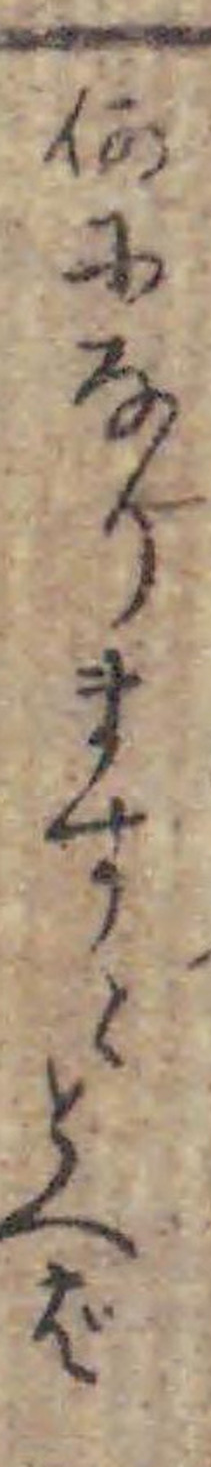何になりますととへば
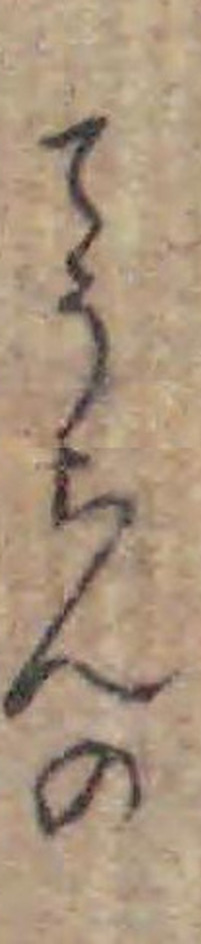てうちんの
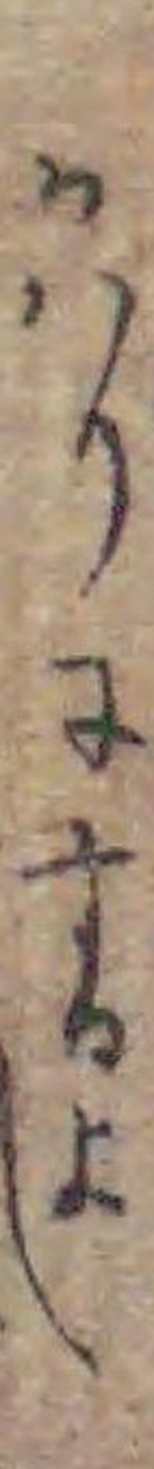かはりにするよし

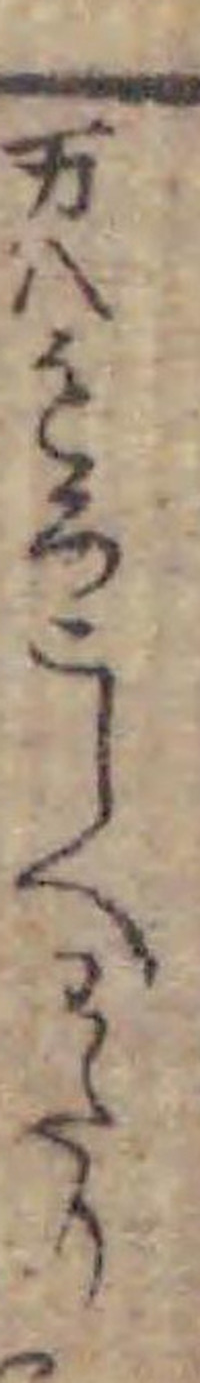万八もろこしへわたり
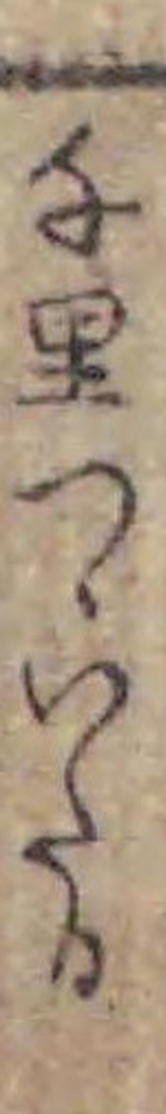千里つゝいたる
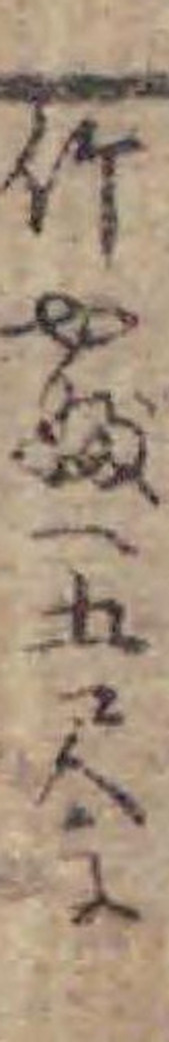竹やぶへ五尺に
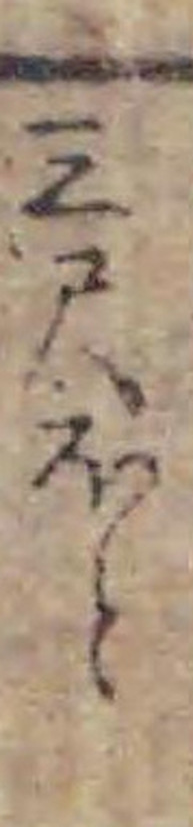三尺ほと
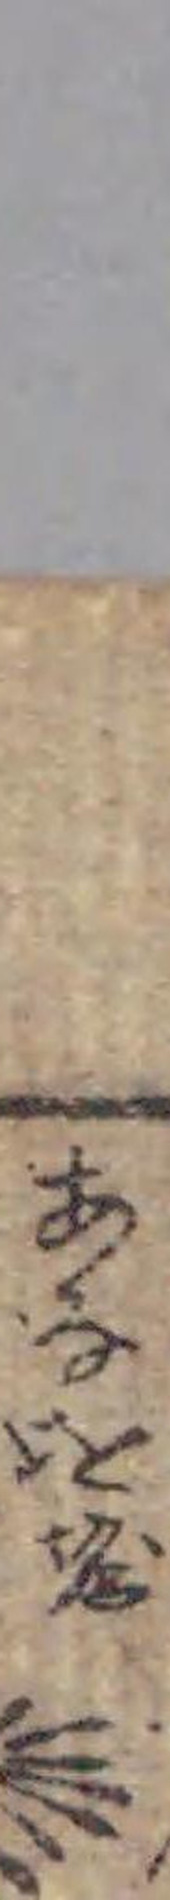あなを掘
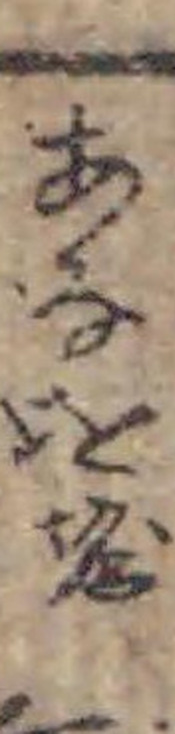あなを掘
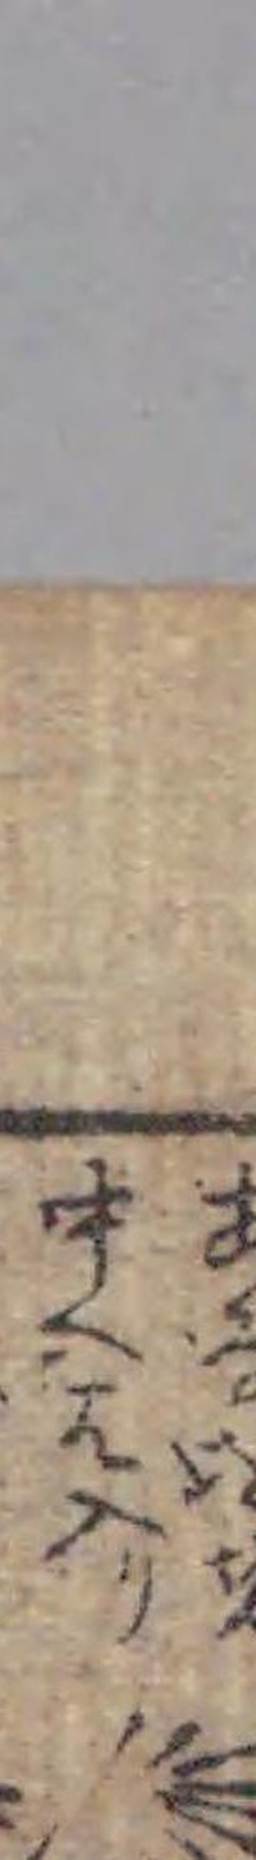中へは入り
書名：虚言八百万八伝 : 3巻
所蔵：国立国会図書館 National Diet Library, JAPAN
